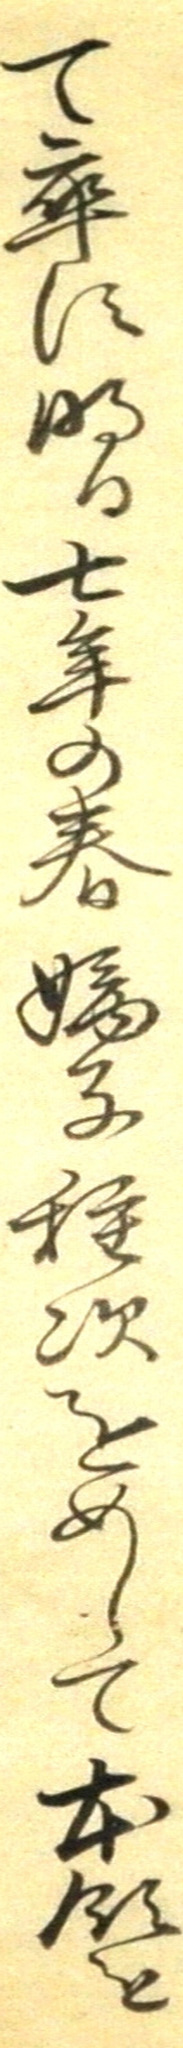て卒す明る七年の春嫡子種次をめして本領を
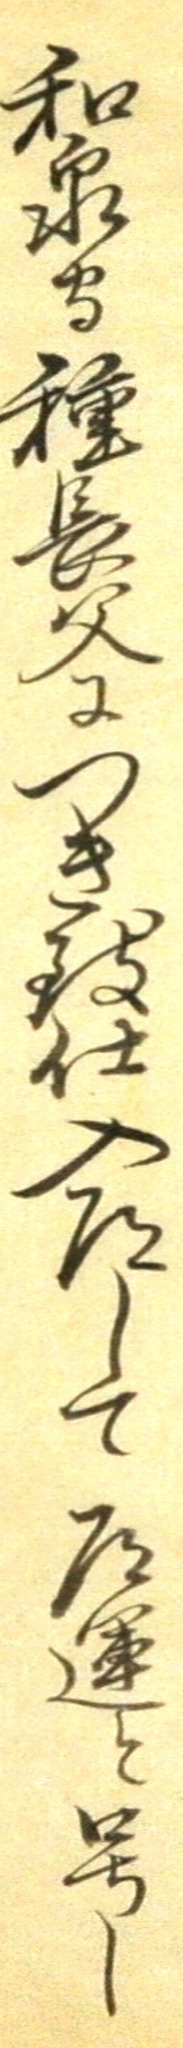和泉守種長父につき致仕入道して道運と号し
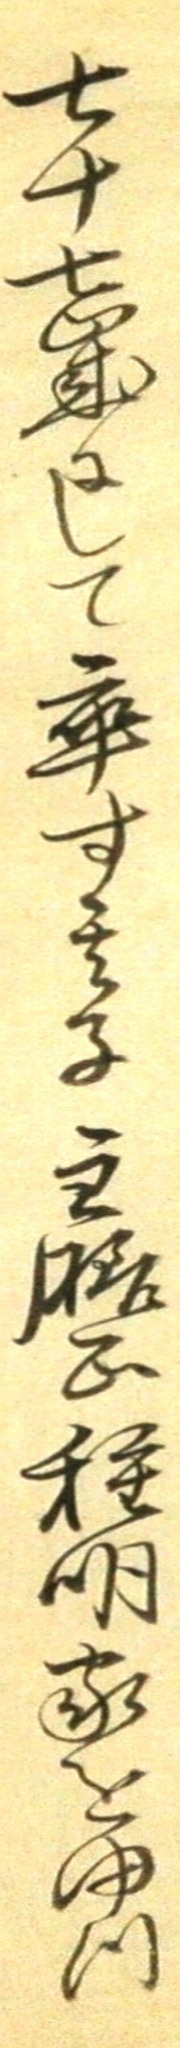七十七歳にして卒す其子主膳正種明家をゆつ

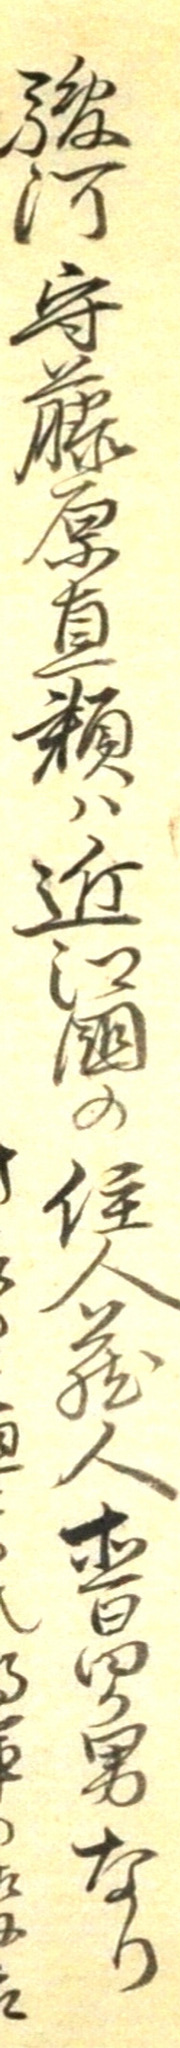駿河守藤原直頼は近江国の住人蔵人直昌か男なり
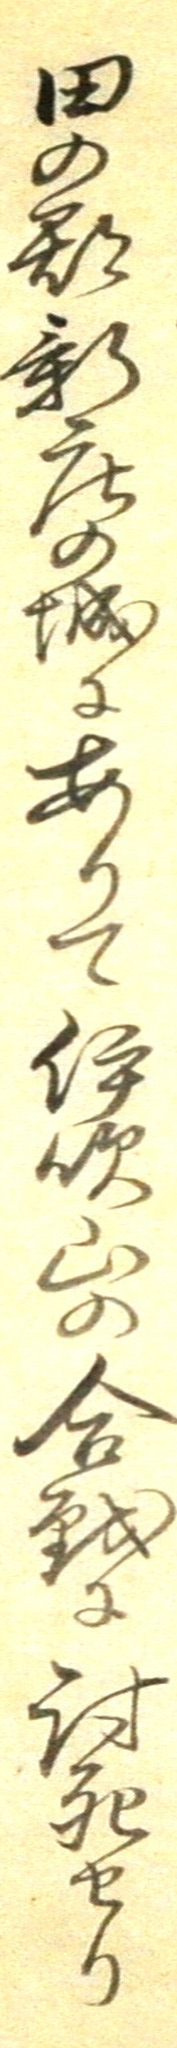田の郡新庄の城にありて伊吹山の合戦に討死せり
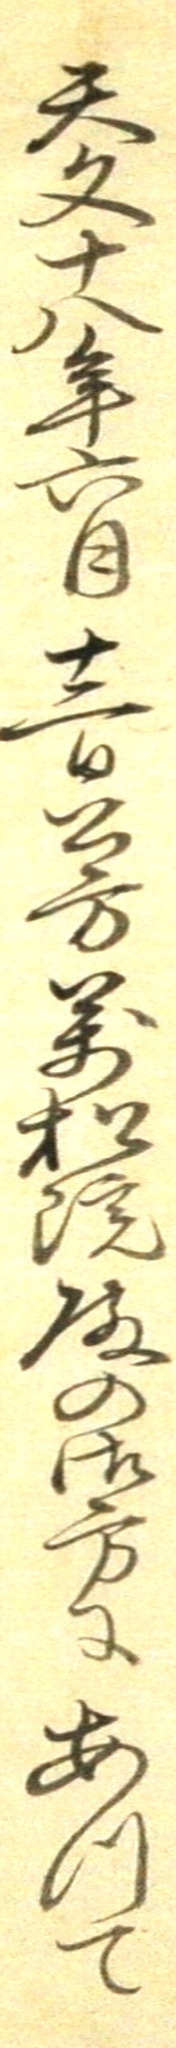天文十八年六月十二日公方万松院殿の御方にあつて
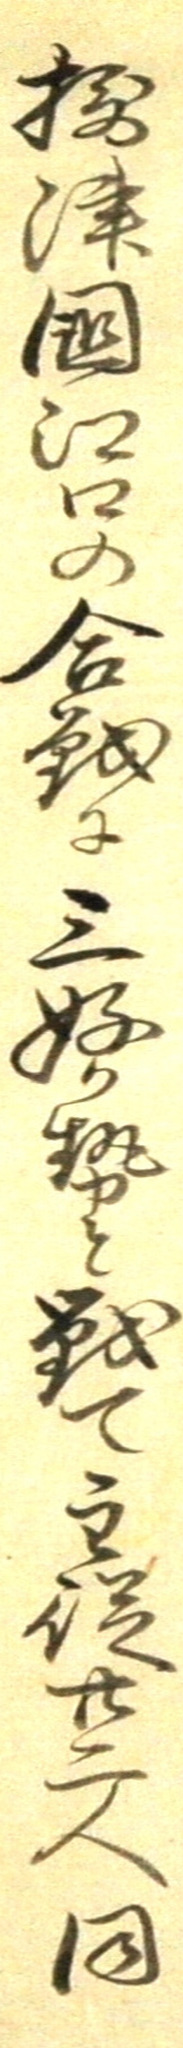摂津の国江口の合戦に三好か勢と戦て主従廿二人同
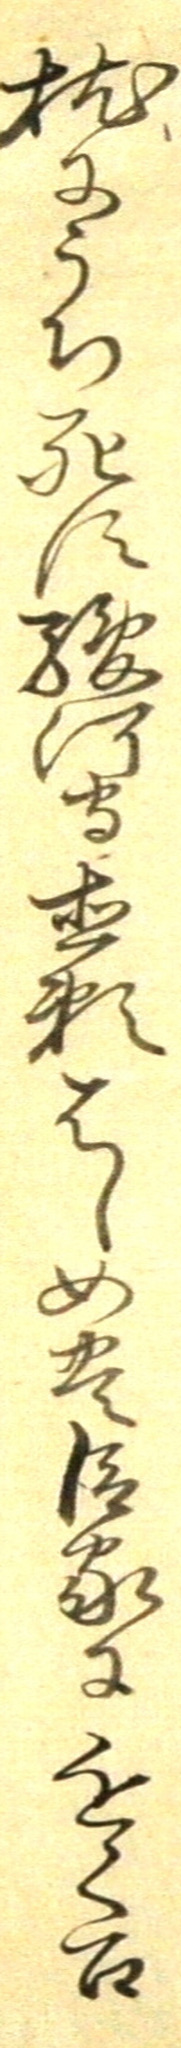枕にうち死す駿河守直頼はしめ豊臣家に近く召

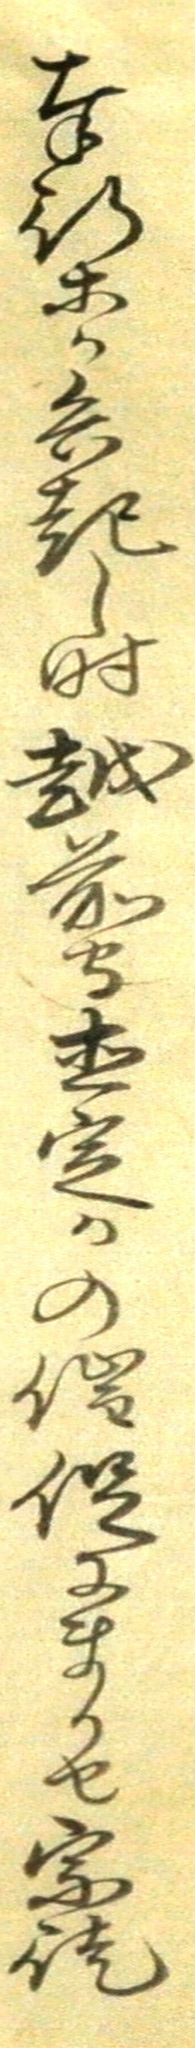奉行等か兵起し時越前守直定かの催促にまかせ宗徒
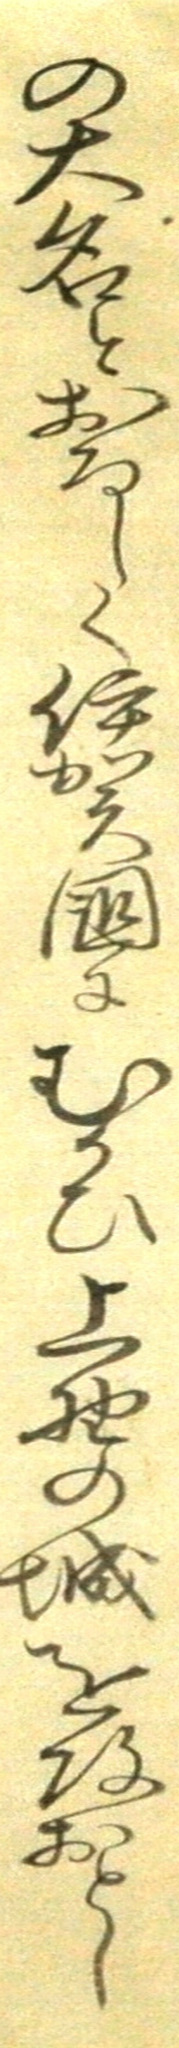の大名とおなしく伊賀国にむかひ上野の城を攻おとし
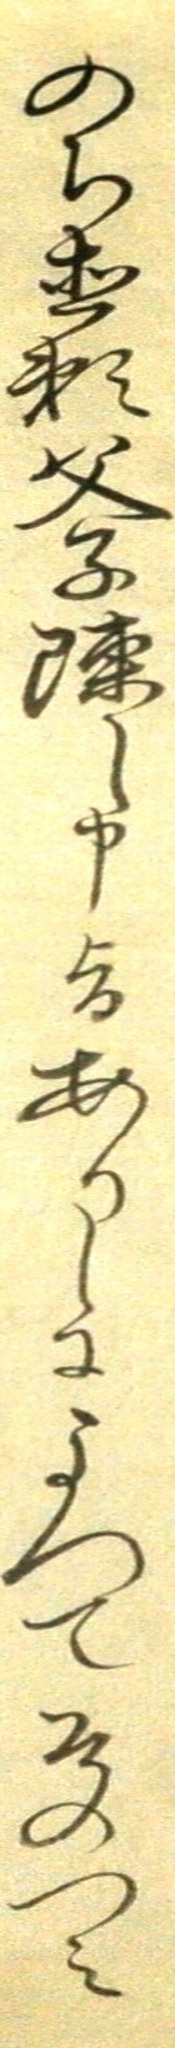のち直頼父子陳し申旨ありしによつてそのつみ
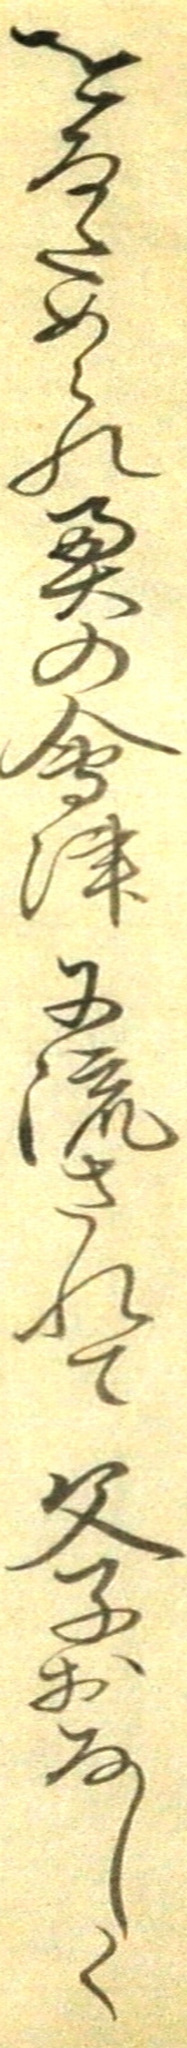をなためられ奥の会津に流されて父子おなしく
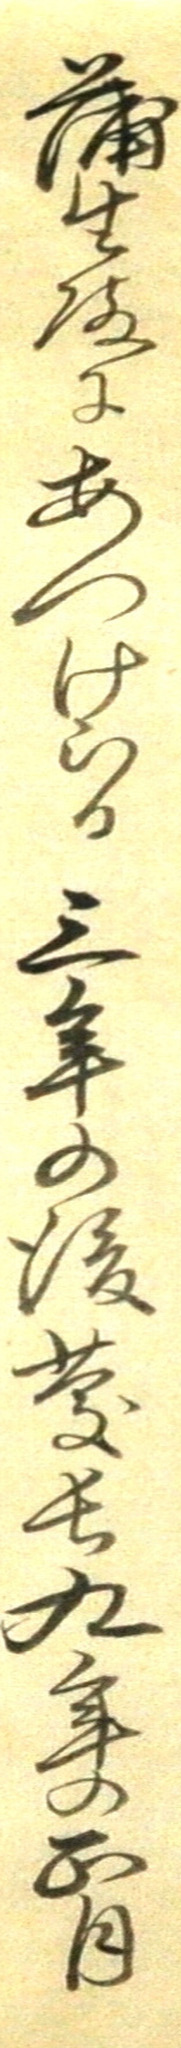蒲生殿にあつけらる三年の後慶長九年の正月
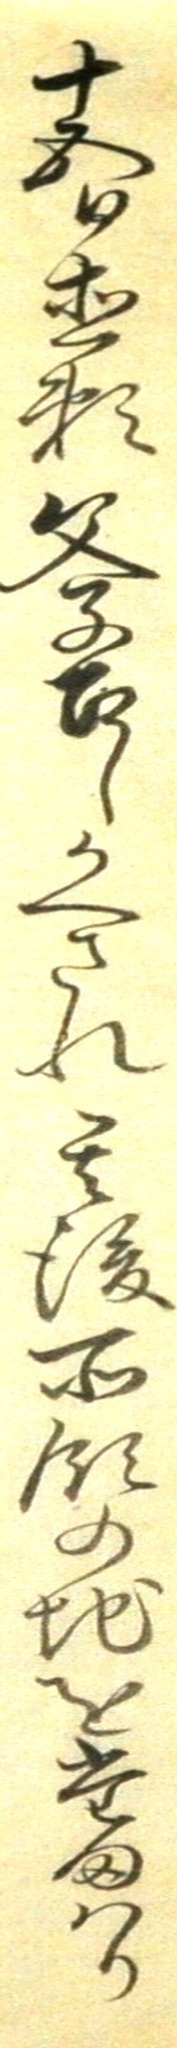十五日直頼父子召しかへされ其後所領の地をたまはり
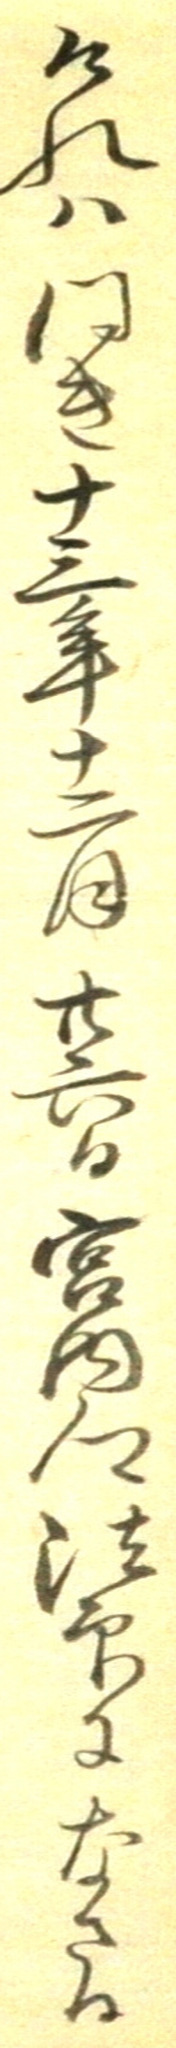けれは同き十三年十二月廿六日宮内卿法印になさる
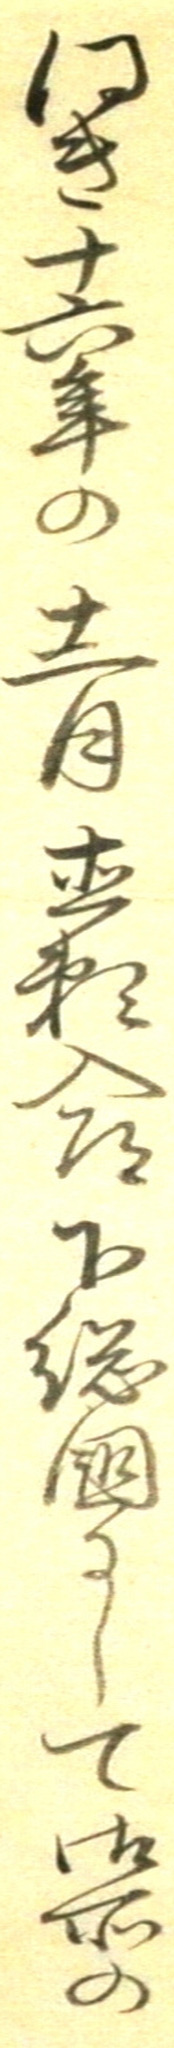同き十六年の十二月直頼入道下総国にして御所の
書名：藩翰譜（八・下）
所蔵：伊那市立高遠町図書館・合同会社AMANE
